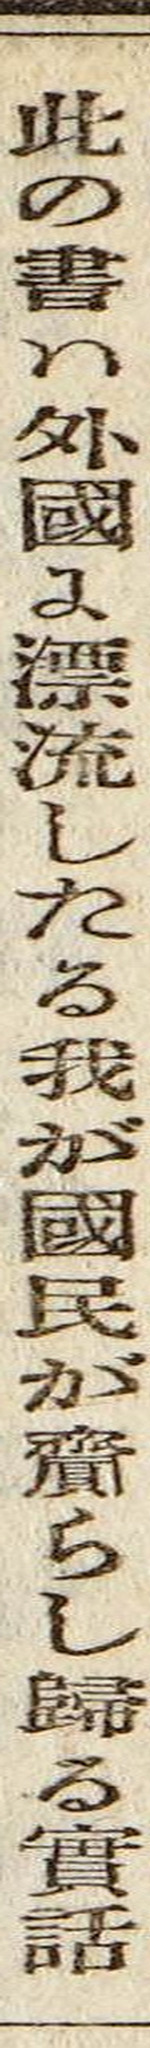此の書は外国に漂流したる我が国民が齎らし帰る実話
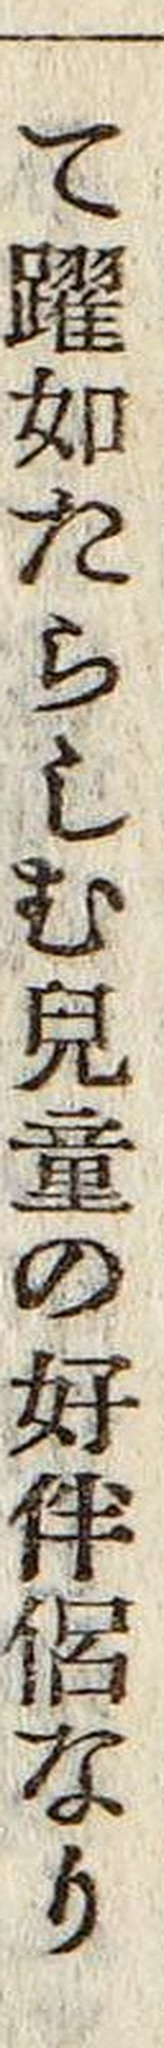て躍如たらしむ児童の好伴侶なり
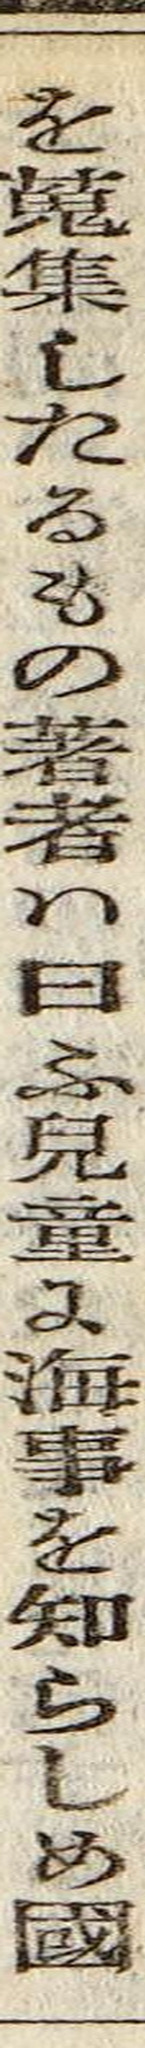を蒐集したるもの著者は曰ふ児童に海事を知らしめ国
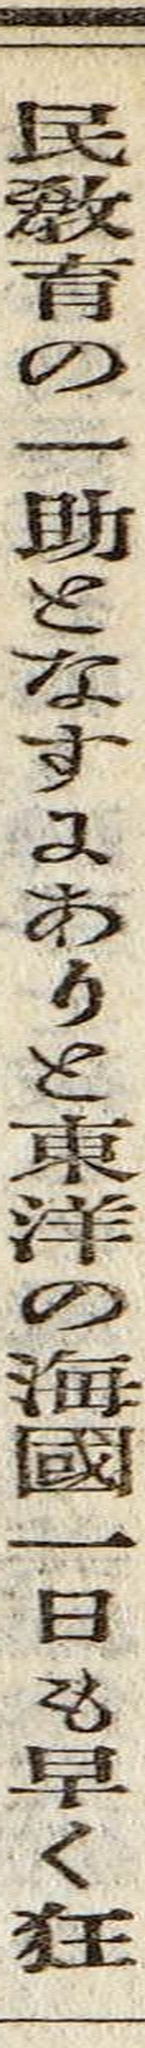民教育の一助となすにありと東洋の海国一日も早く狂
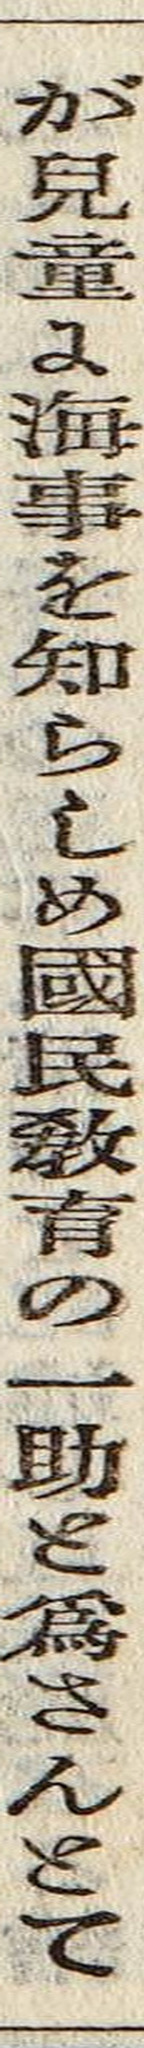が児童に海事を知らしめ国民教育の一助と為さんとて
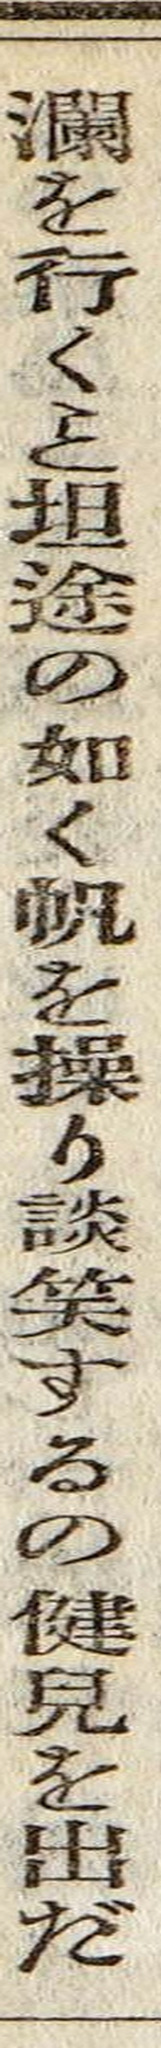瀾を行くこと坦途の如く帆を操り談笑するの健児を出だ
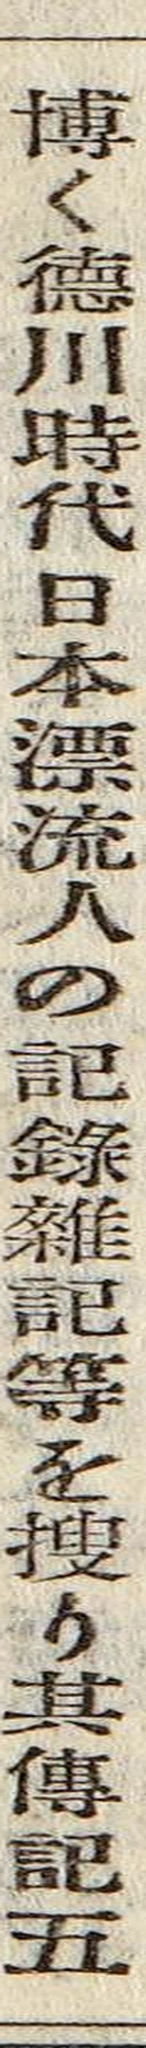博く徳川時代日本漂流人の記録雑記等を捜り其伝記五
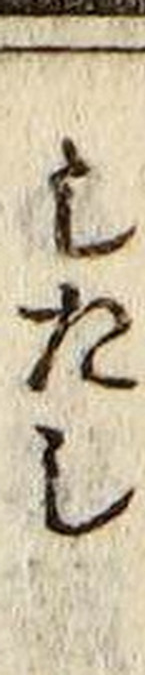したし
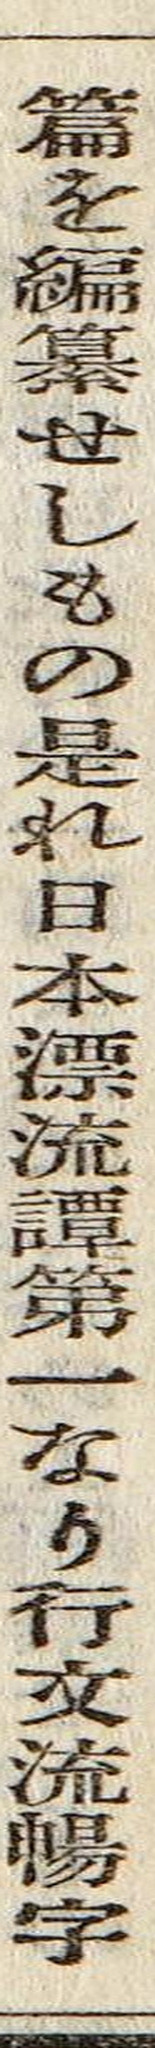篇を編纂せしもの是れ日本漂流譚第一なり行文流暢字
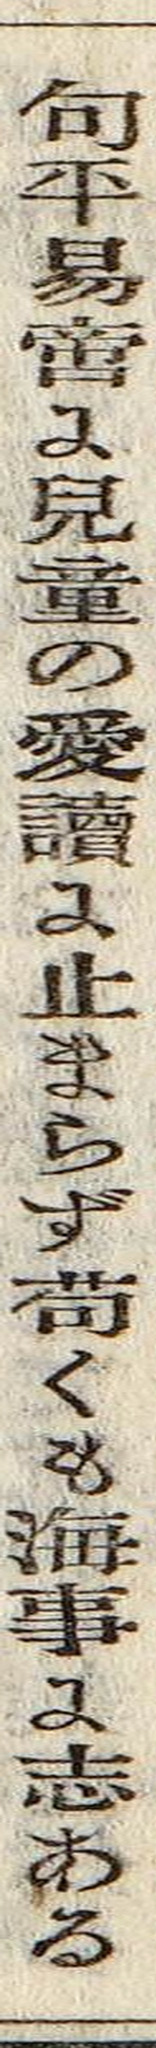句平易啻に児童の愛読に止まらず苟くも海事に志ある
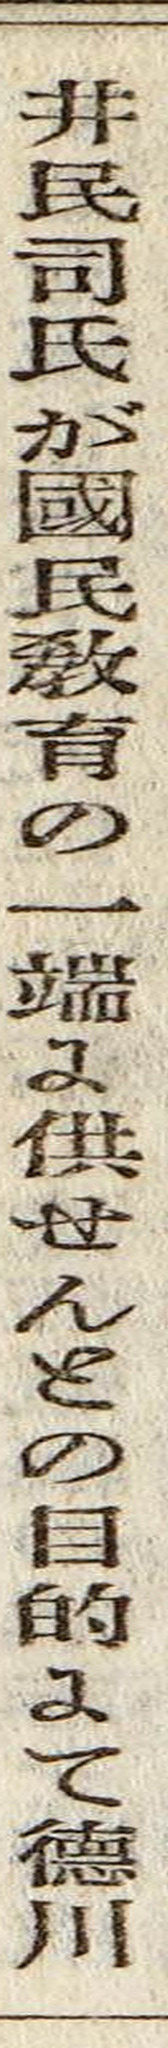井民司氏が国民教育の一端に供せんとの目的にて徳川
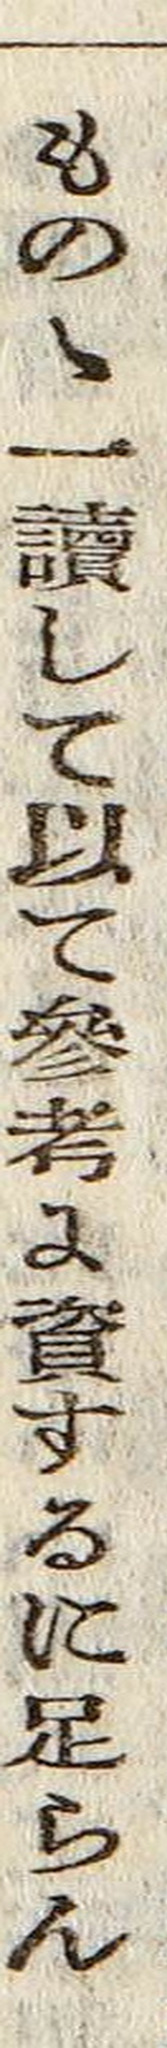ものゝ一読して以て参考に資するに足らん
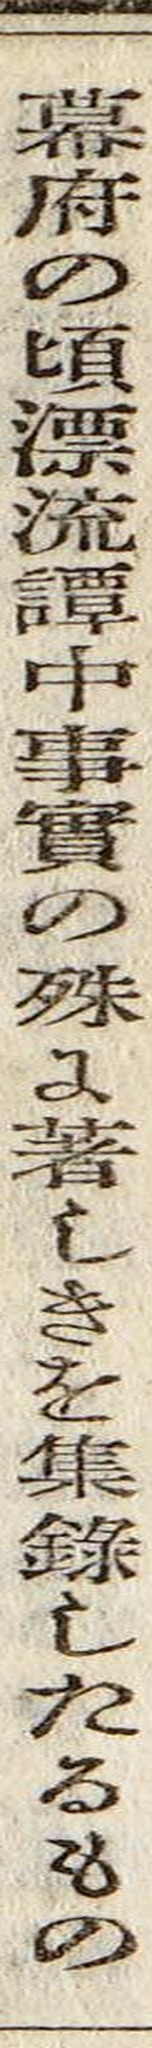幕府の頃漂流譚中事実の殊に著しきを収録したるもの
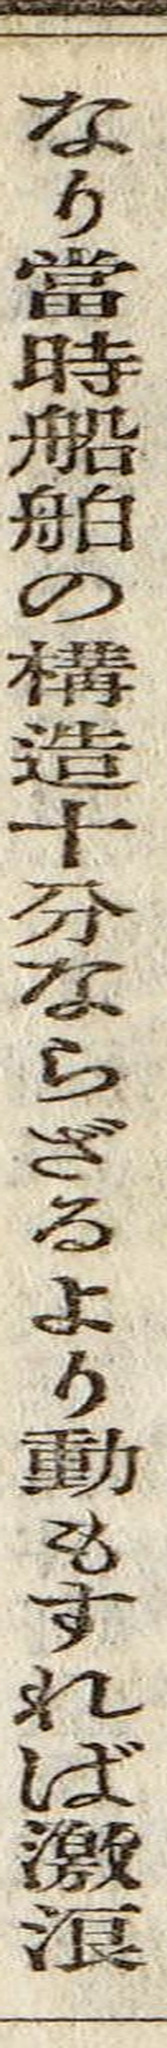なり当時船舶の構造十分ならざるより動もすれば激浪
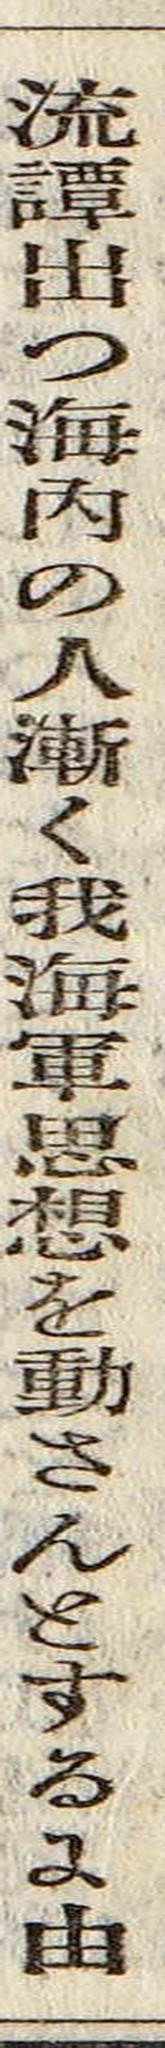流譚出つ海内の人漸く我海軍思想を動さんとするに由
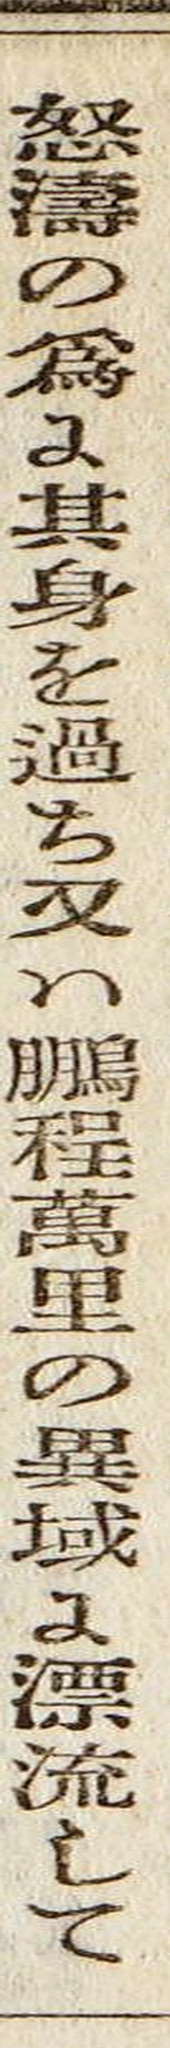怒涛の為に其身を過ち又は鵬程萬里の異域に漂流して
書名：日本漂流譚
